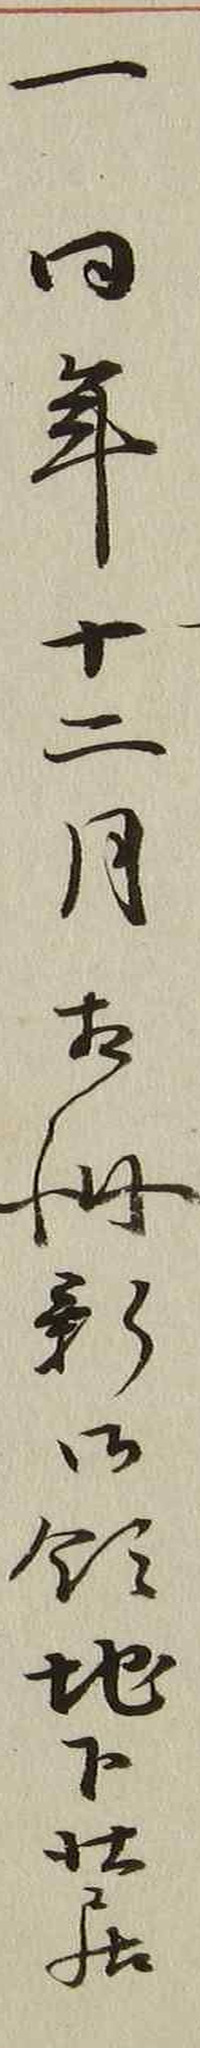一同年十二月新御領知下仕居
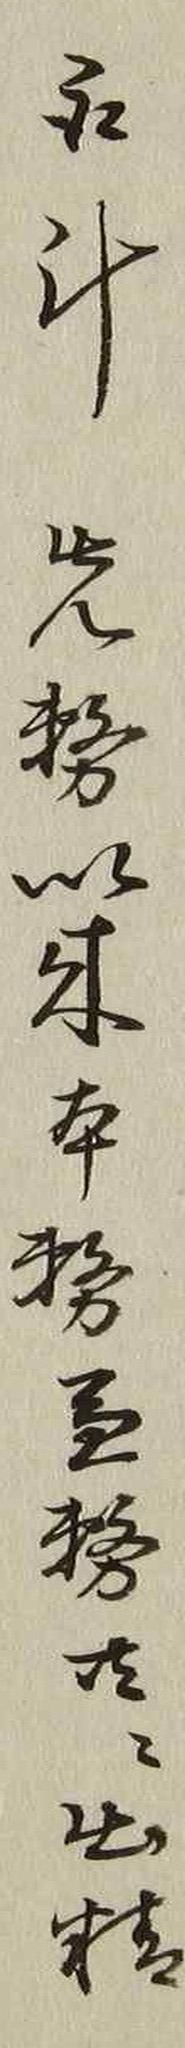取り斗り先努以来本努兼務共ニ出精
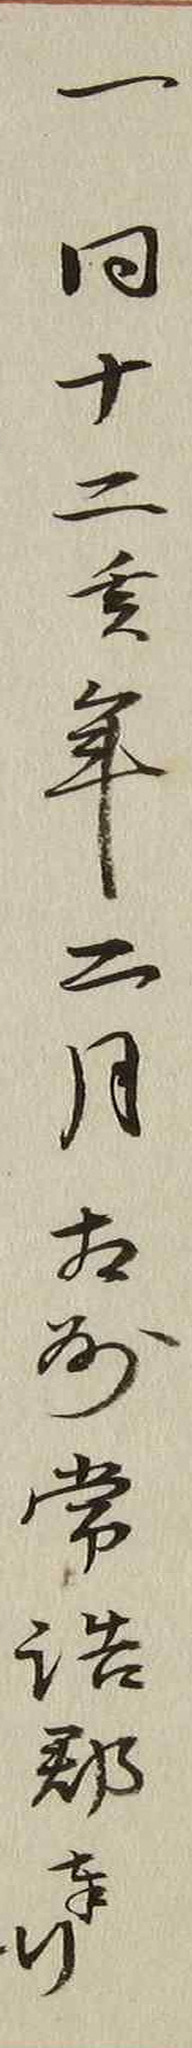一同十二亥年二月常詰郡奉行
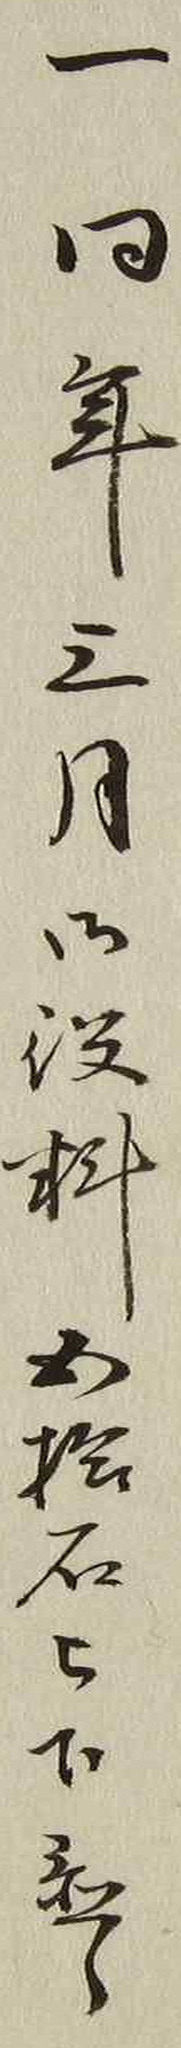一同年三月役料五拾石下し置かれ候
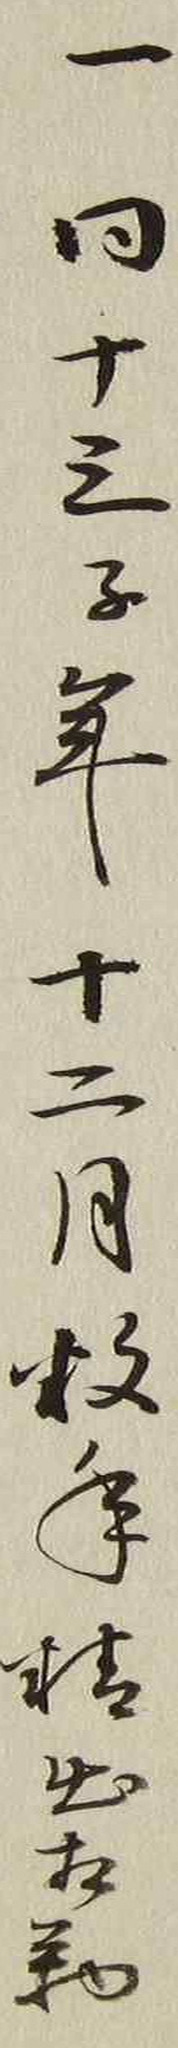一同十三子年十二月数年精出相勤め
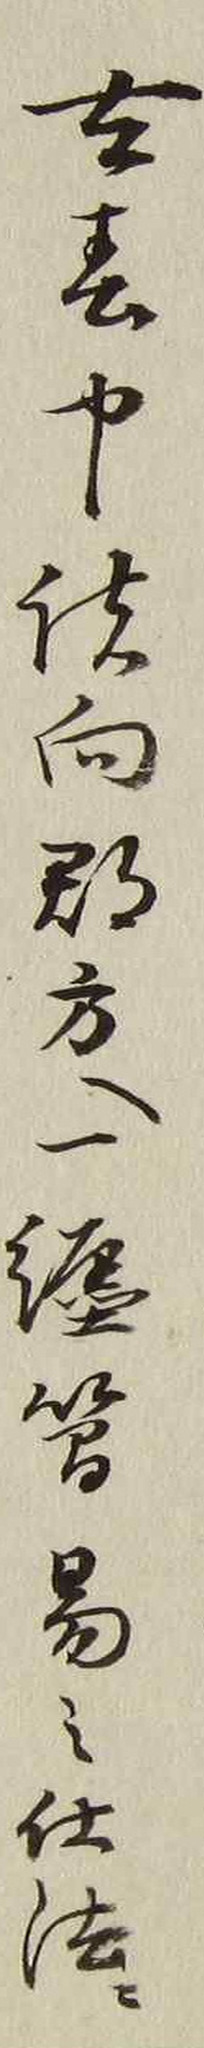去春申し談じ向郡方へ一纒簡易之仕法ニ

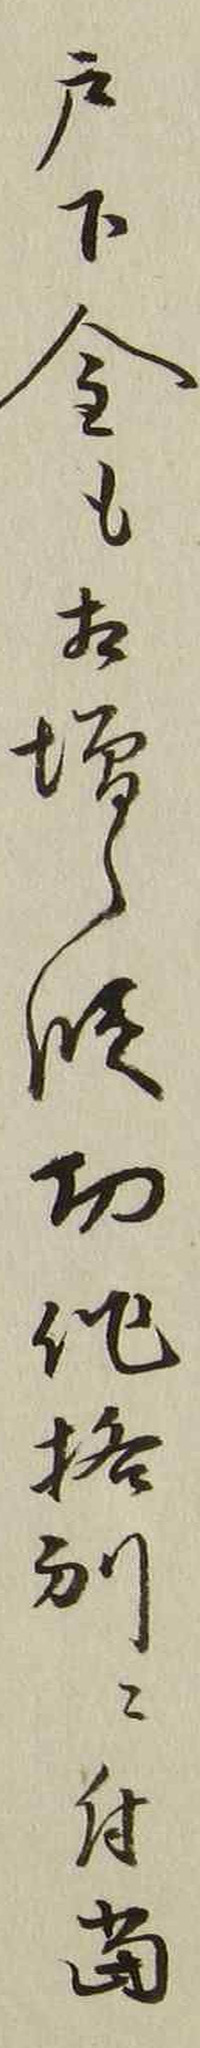戸下金も相増し候段功作格別ニ付き当
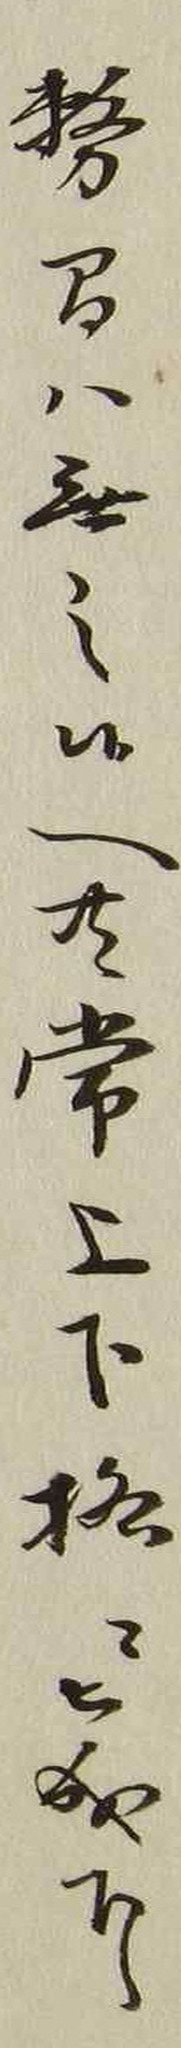努間ハ之無く候へ共常上下格ニ成し下され候
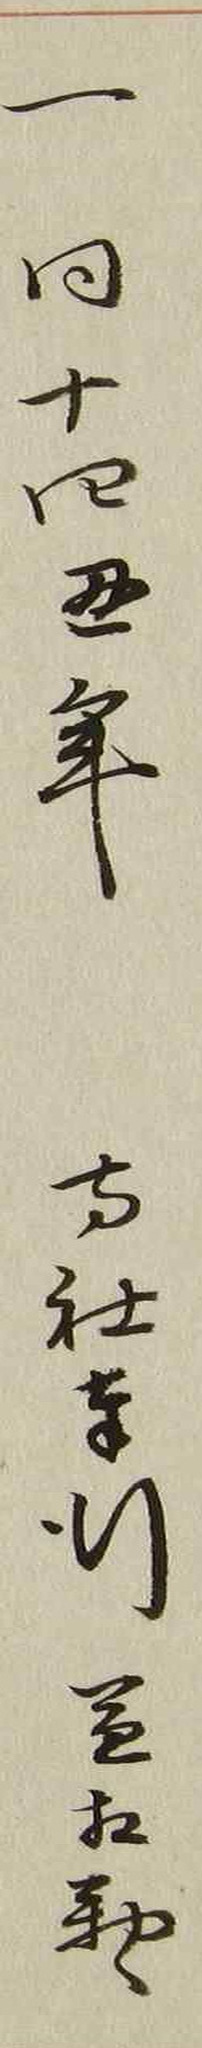一同十四丑年寺社奉行兼ね相勤め候
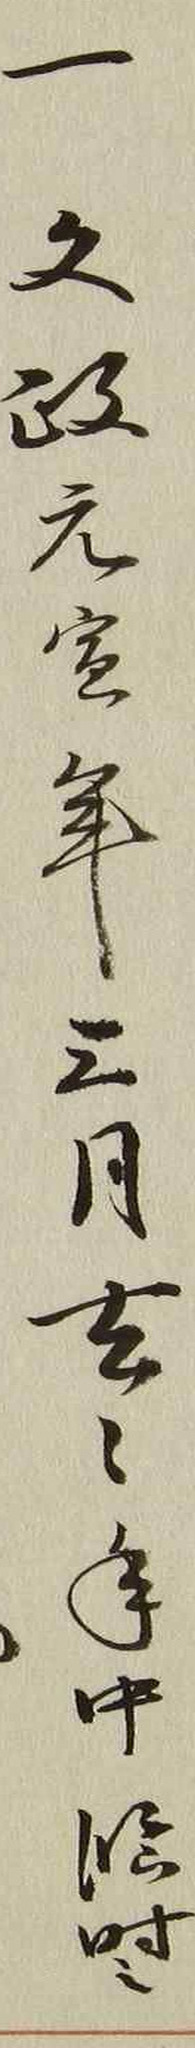一文政元寅年三月去々年中臨時之
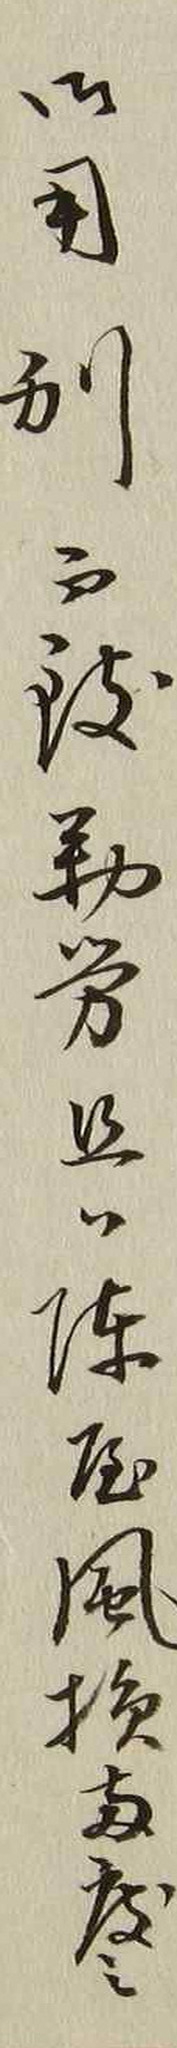御用別して勤労致し且つ陣屋風様両度之
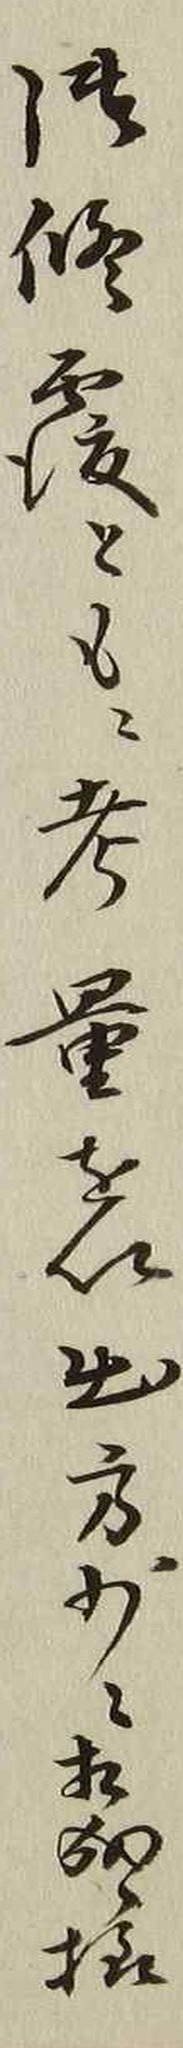御修覆ともニ考量を以て出方少しニ相成候様
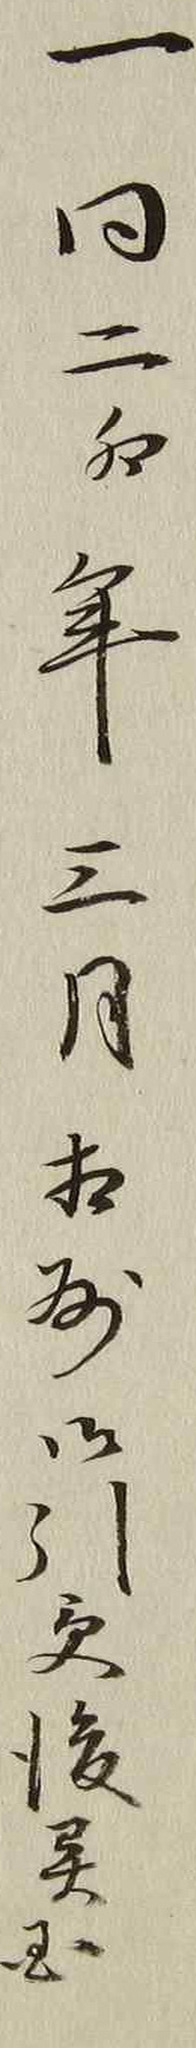一同二卯三月相州御引受後異国
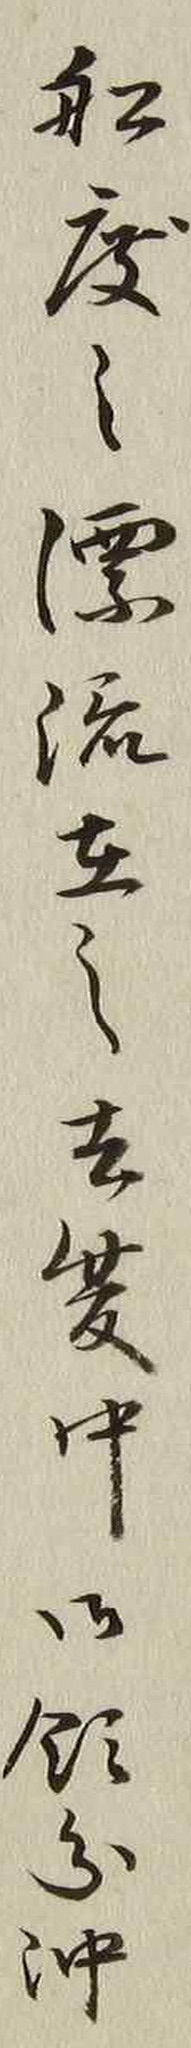船度々漂流之在り去夏中御領分沖
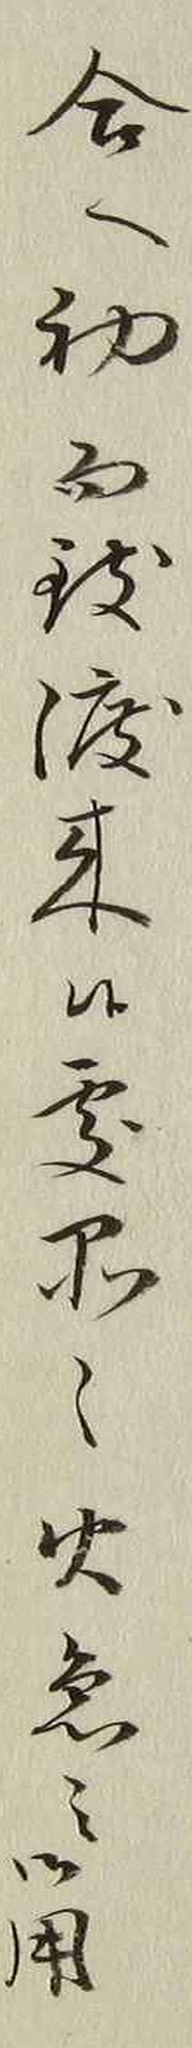合へ初めて渡来致し候処品々火急之御用
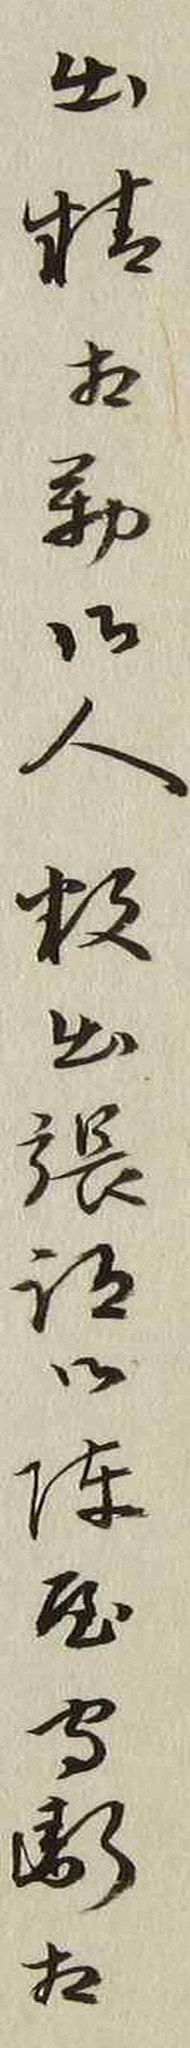出精相勤め御人数出張跡御陣屋守衛相
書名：諸士系譜　巻之16　い之部16
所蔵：会津若松市立会津図書館
